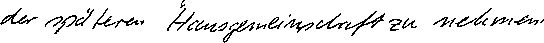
der späteren Hausgemeinschaft zu nehmen.
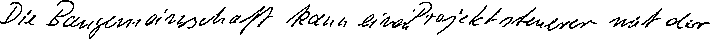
Die Baugemeinschaft kann einen Projektsteuerer mit der
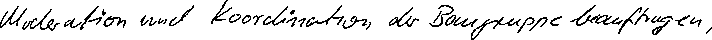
Moderation und Koordination der Baugruppe beauftragen,
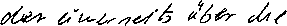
der seinerseits über die
